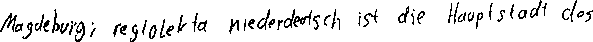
Magdeburg ; regiolektal niederdeutsch ist die Hauptstadt des
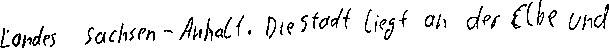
Landes Sachsen-Anhalt. Die Stadt liegt an der Elbe und
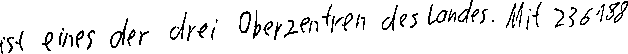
ist eines der drei Oberzentren des Landes. Mit 236.188
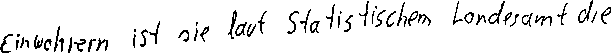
Einwohnern ist sie laut Statistischem Landesamt die
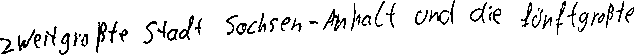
zweitgrößte Stadt Sachsen-Anhalts und die fünftgrößte
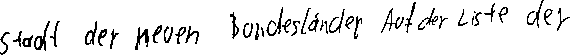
Stadt der neuen Bundesländer. Auf der Liste der
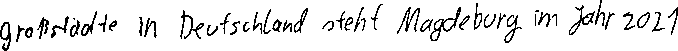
Großstädte in Deutschland steht Magdeburg im Jahr 2021
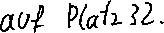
auf Platz 32.
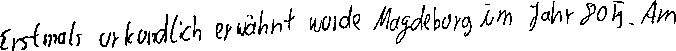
Erstmals urkundlich erwähnt wurde Magdeburg im Jahr 805. Am
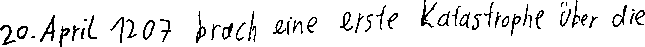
20. April 1207 brach eine erste Katastrophe über die
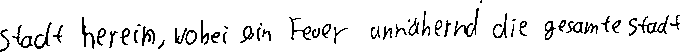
Stadt herein, wobei ein Feuer annähernd die gesamte Stadt
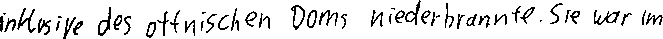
inklusive des ottonischen Doms niederbrannte. Sie war im
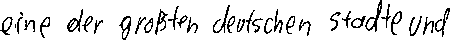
eine der größten deutschen Städte und
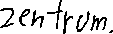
Zentrum
